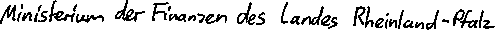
Ministerium der Finanzen des Landes Rheinland-Pfalz
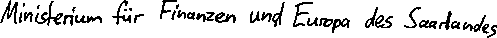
Ministerium für Finanzen und Europa des Saarlandes
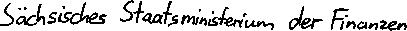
Sächsisches Staatsministerium der Finanzen
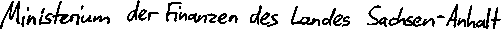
Ministerium der Finanzen des Landes Sachsen-Anhalt
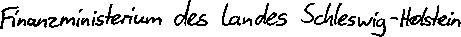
Finanzministerium des Landes Schleswig-Holstein
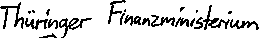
Thüringer Finanzministerium
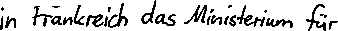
in Frankreich das Ministerium für
